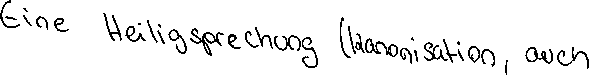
Eine Heiligsprechung (Kanonisation, auch
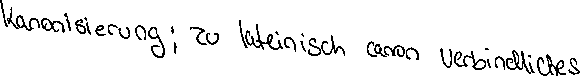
Kanonisierung; zu lateinisch canon verbindliches
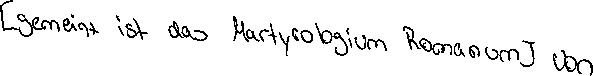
[gemeint ist das Martyrologium Romanum] von
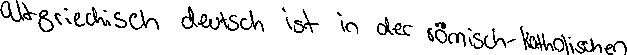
altgriechisch deutsch ist in der römisch-katholischen
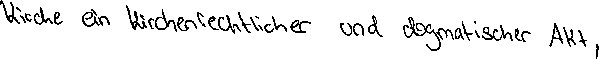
Kirche ein kirchenrechtlicher und dogmatischer Akt,
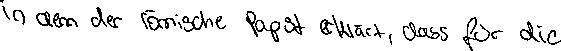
in dem der römische Papst erklärt, dass für die
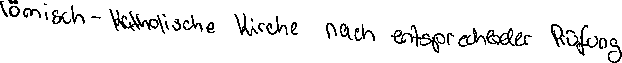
römisch-katholische Kirche nach entsprechender Prüfung
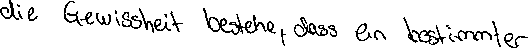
die Gewissheit bestehe, dass ein bestimmter
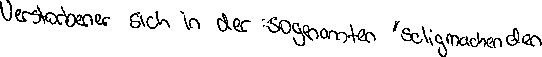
Verstorbener sich in der sogenannten "seligmachenden
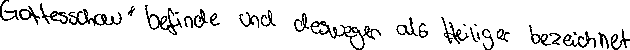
Gottesschau" befinde und deswegen als Heiliger bezeichnet
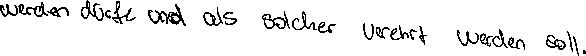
werden dürfe und als solcher verehrt werden soll.
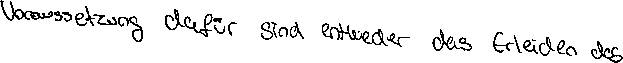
Voraussetzung dafür sind entweder das Erleiden des
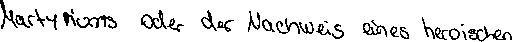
Martyriums oder der Nachweis eines heroischen
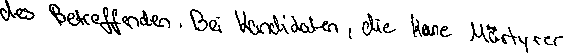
des Betreffenden. Bei Kandidaten, die keine Märtyrer
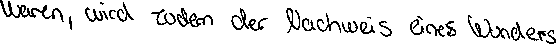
waren, wird zudem der Nachweis eines Wunders
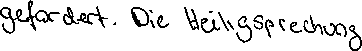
gefordert. Die Heiligsprechung
